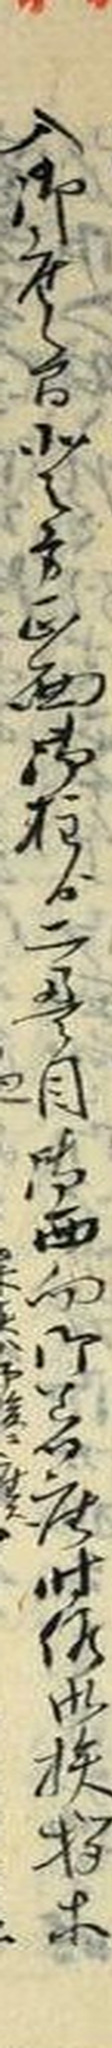入御座之間北之方正面御柱ゟ二畳目西向御着座時候御挨拶等
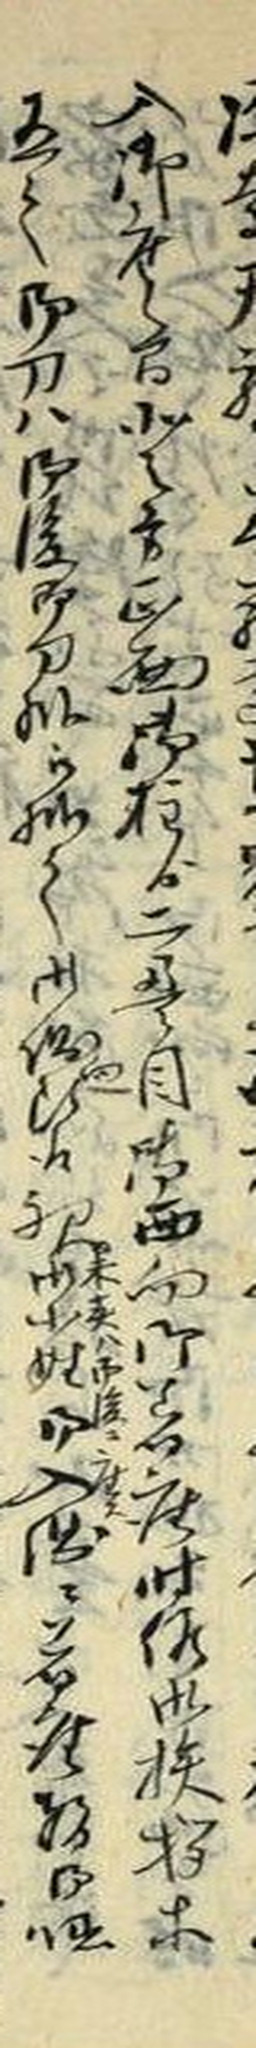有之御刀ハ御後御刀掛被掛之御側向頭取初〇未春ハ御後ニ座ス御小姓御入側ニ着座暫御咄
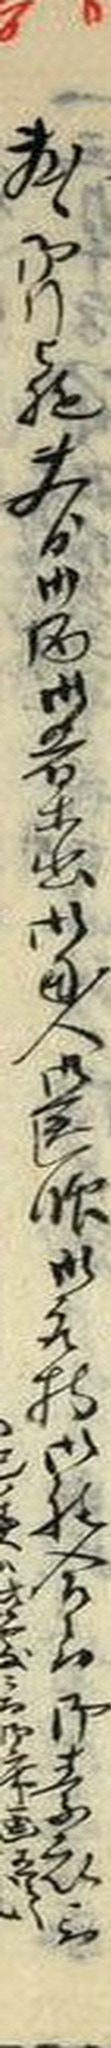敷へ御引被遊夫ゟ御酒御肴等出御用人御医師御取持御程合ニ而御素衣ニ而
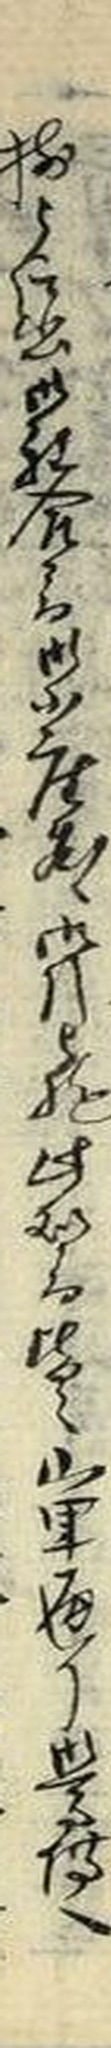揃被仰出御程合ニ而御小座敷へ御引被遊此処ニ而皆々山里通り御馬場へ
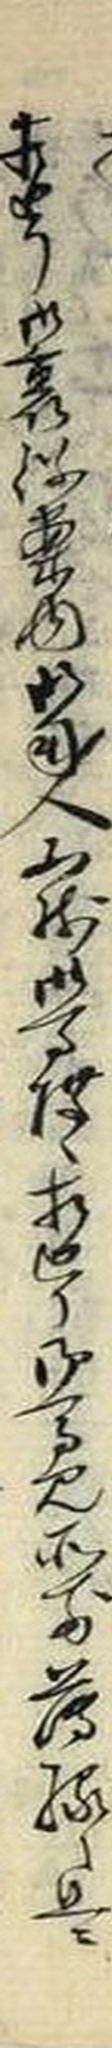相廻り御裏役御案内御用人不残御馬場へ相廻り御馬見所前薄縁之上ニ
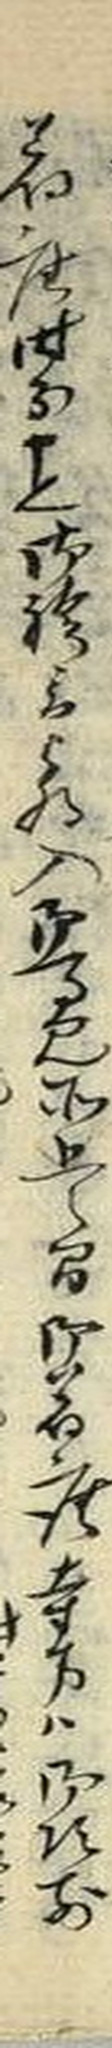着座時分申上御袴ニ而被為入御馬見所上之間御着座寺方ハ御次前
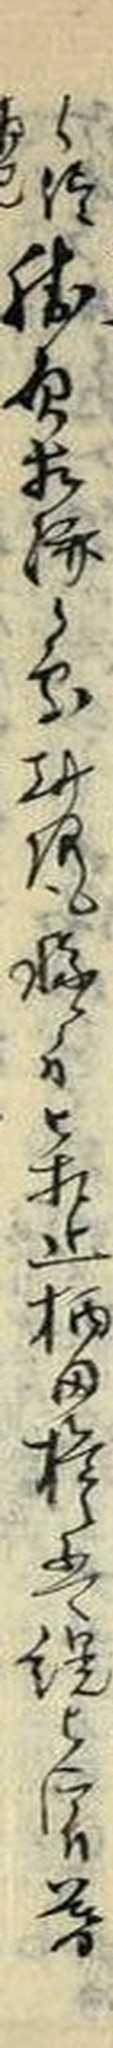拝見勝負相済候処刻限も移候ニ付被相止柄田権之丞へ縨被仰付暮
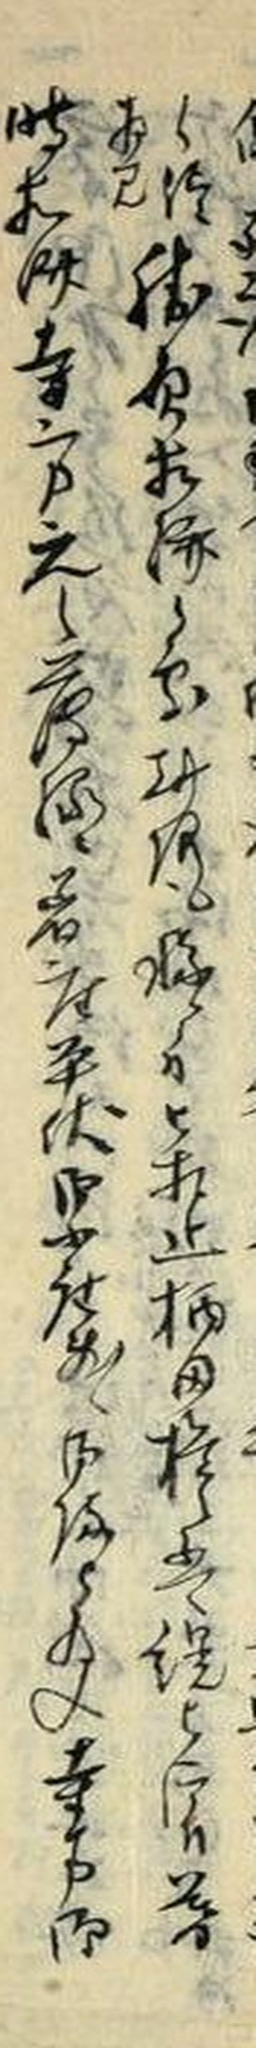時相済寺方元之薄縁ニ着座平伏御小座敷へ御帰被為入寺方御

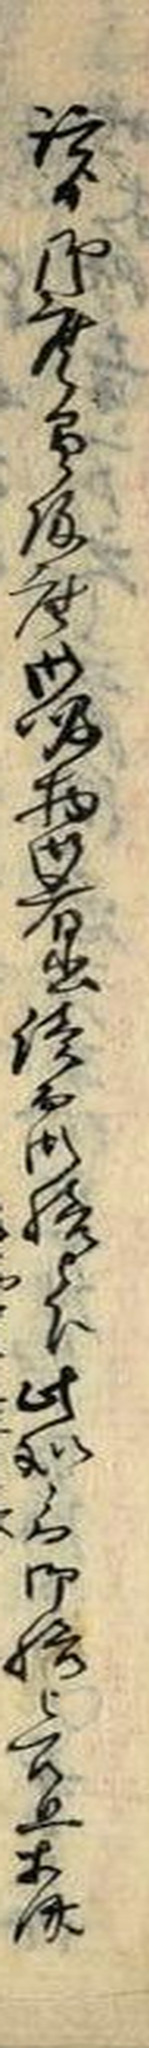跡ゟ御座之間へ帰座御吸物御肴出続而御膳被下此処ニ而御膳被召上相済
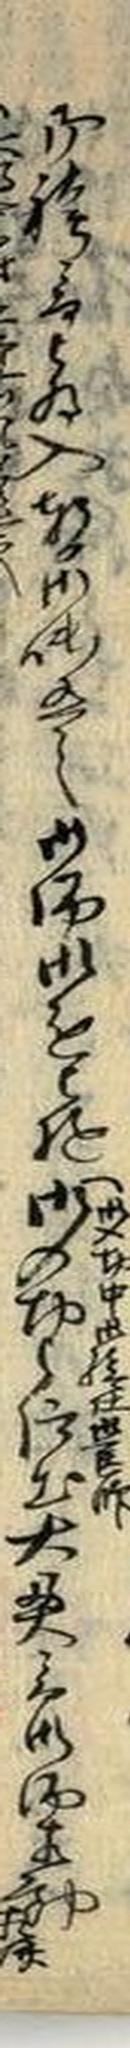御袴ニ而被為入暫御咄有之御酒御進被遊御〆切中御給仕御医師御〆切被仰出大奥ニ而御酒相勧相済
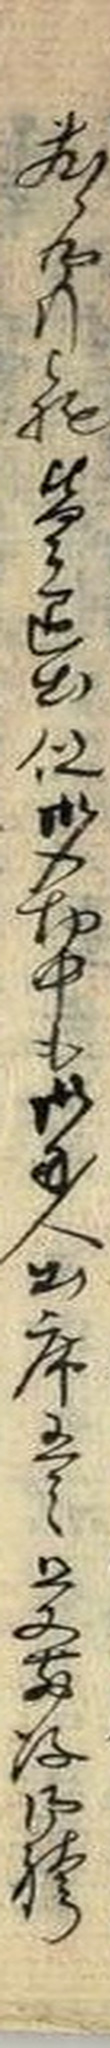敷へ御引被遊皆々退出但御〆切中も御用人出席有之且又前後御袴
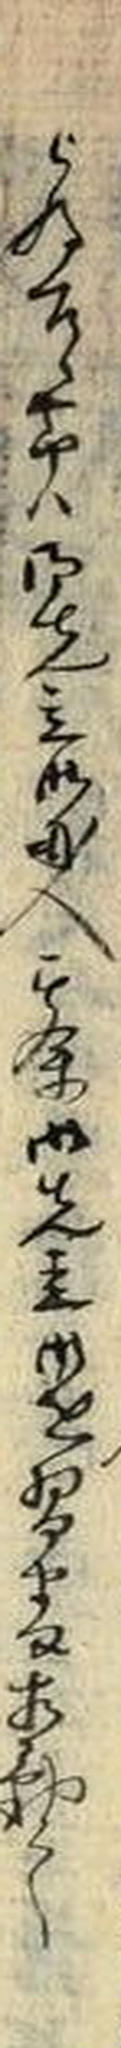被為召候節ハ御先立御用人其余御先立御近習番相勤之
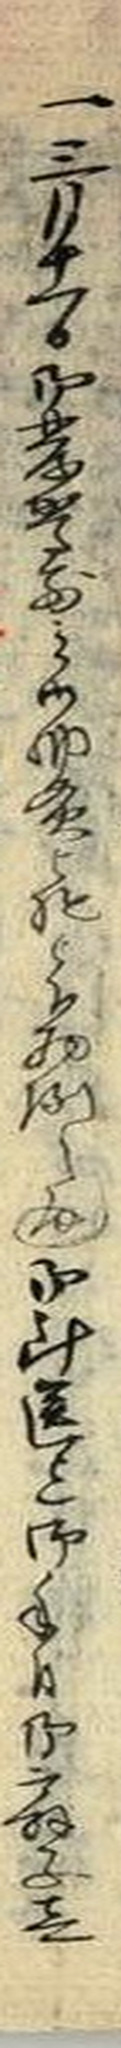一三月十一日御発駕前之御納灸被遊被下物例之通御針医迄御手自御扇子壱
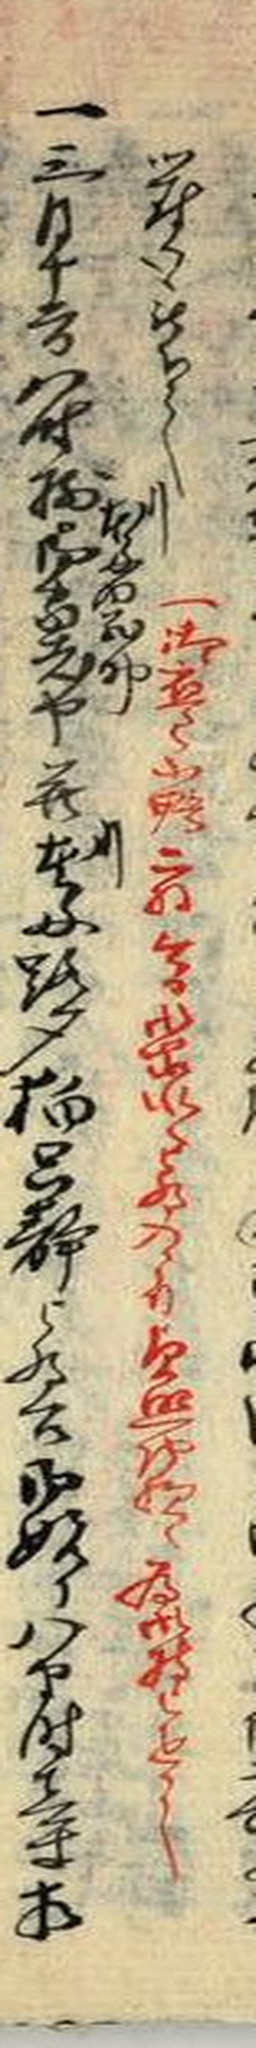一三月十二日八時揃引本多内蔵助御家老中幷引本多路夕狛只静被為召御始り八半時壱寸相
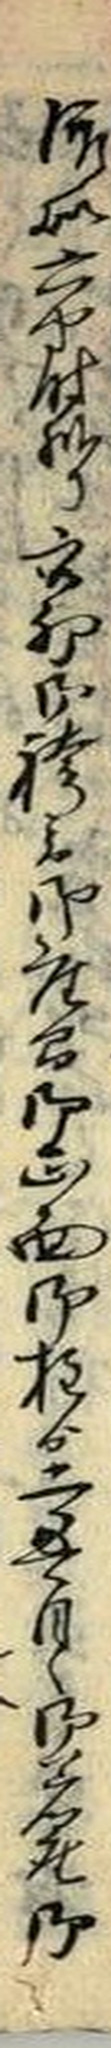済候処六半時掛り最初御袴ニ而御座間御正面御柱ゟ二畳目へ御着座御
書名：少傅日録抄（斉承付側向頭取日記、在国）
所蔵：福井県文書館 Fukui Prefectural Archives
